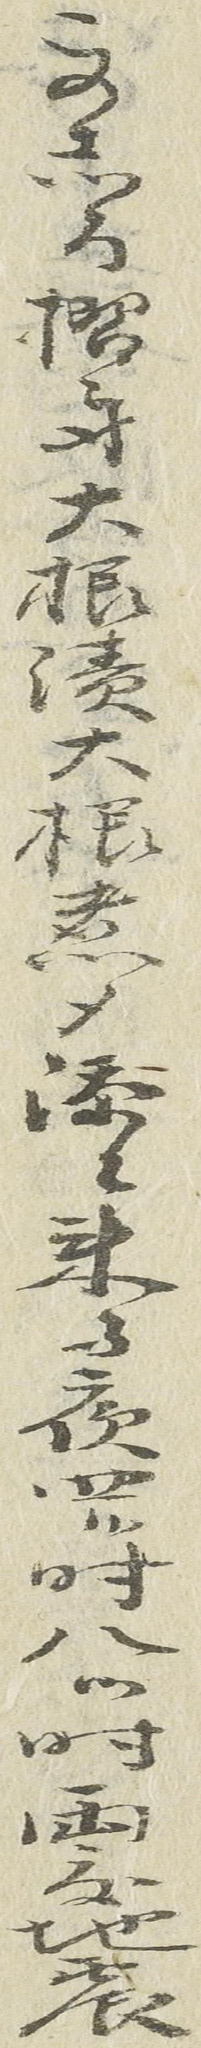このしろ摺身大根漬大根煮〆添て来る四ツ時八ツ時雨及地震

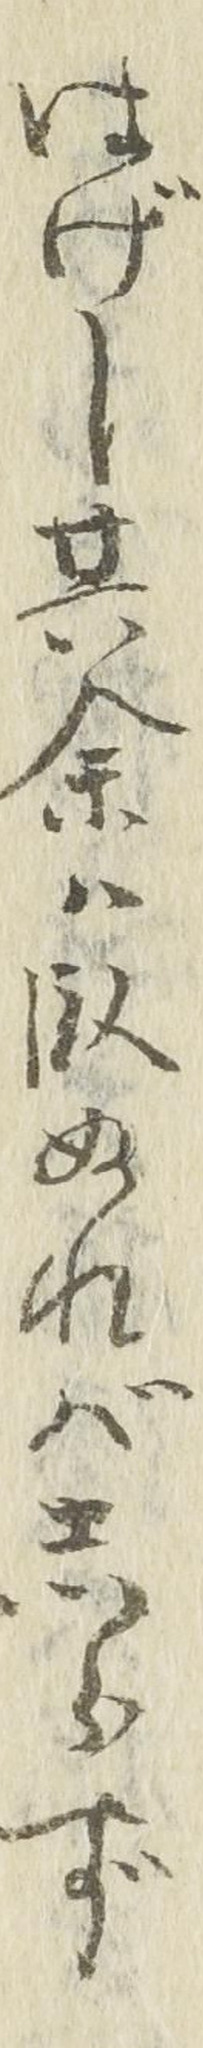はげし其余は臥ぬればしらず
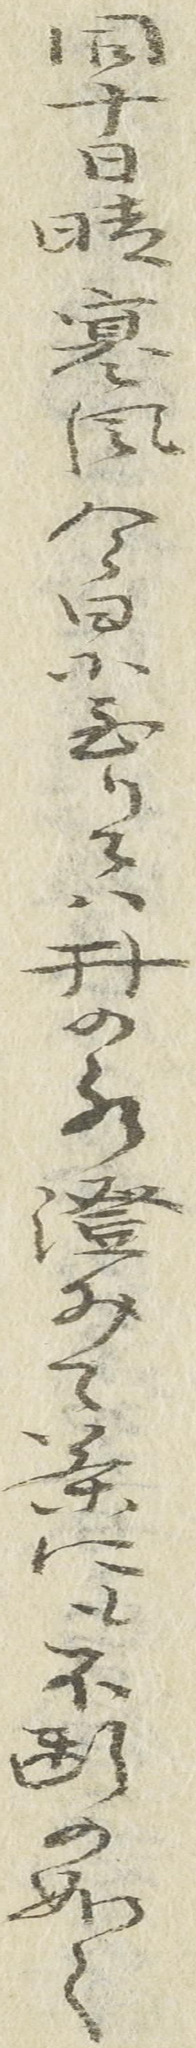同十日晴寒風今日に至りては井の水澄みて茶にも不断の如く
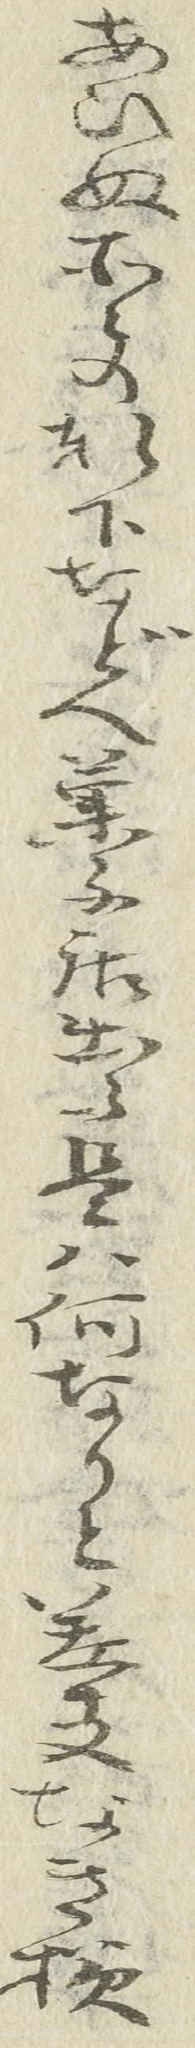あひぬ所々の軒下などへ菓子店出る是は何なりと差支なき様
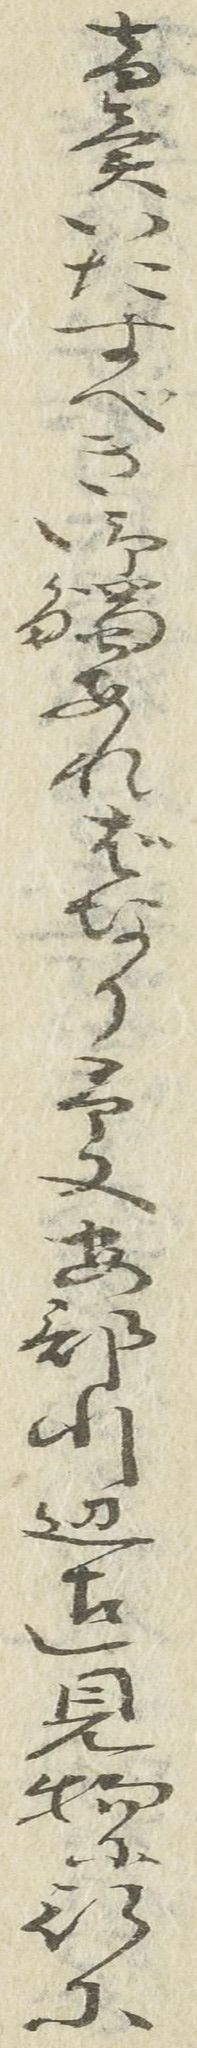商売いたすべき御触あればなり予又安部川辺迄見物に行に
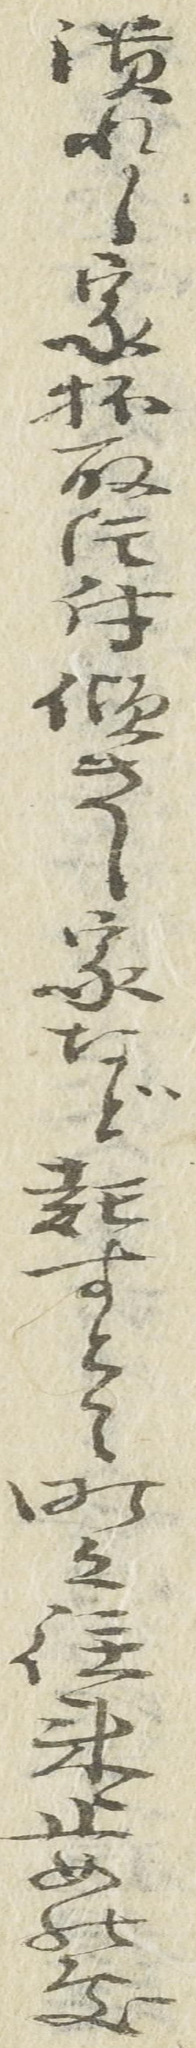潰れし家抔取片付傾きし家など起すとて町々往来止めの処
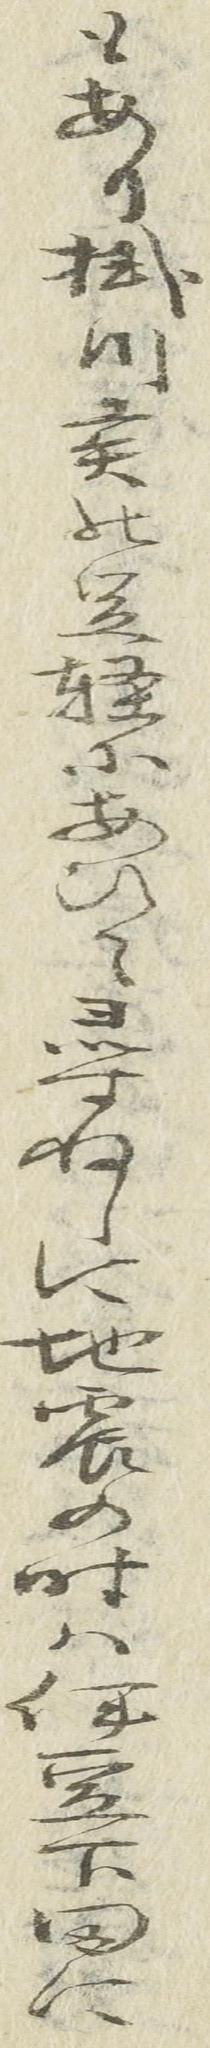もあり掛川侯の足軽にあひて尋ねしに地震の時は伊豆下田に
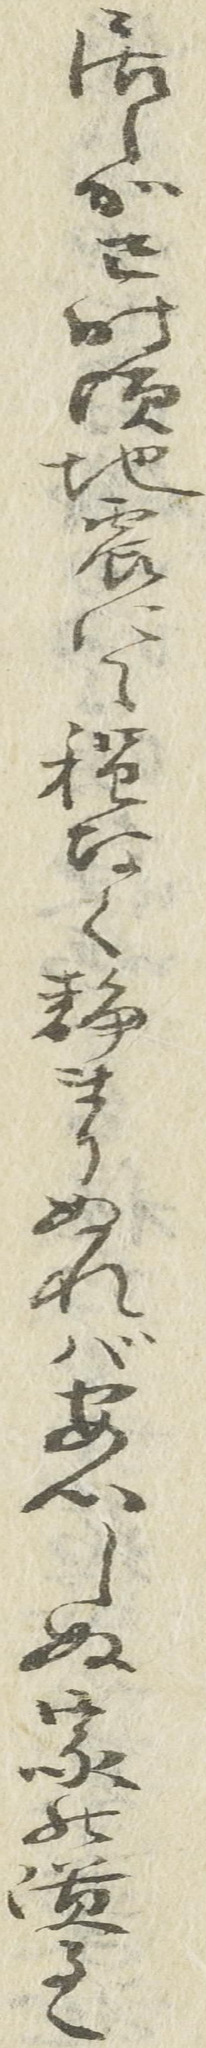居しが巳時頃地震にて程なく静まりぬれば安心しぬ家の潰るゝ
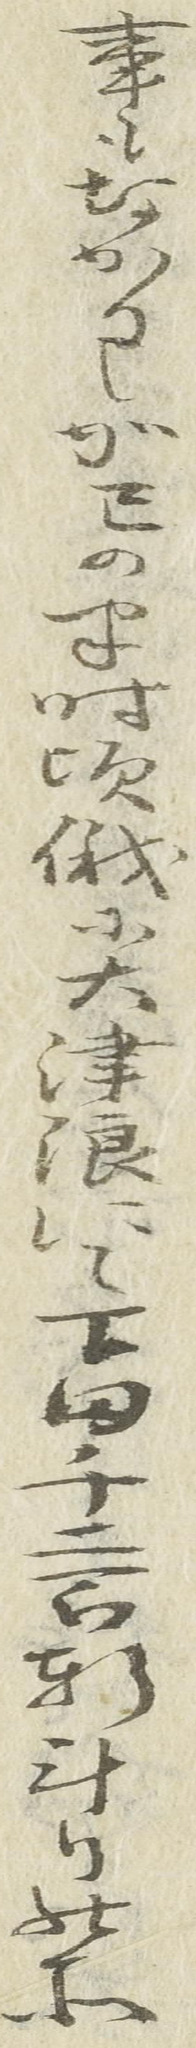事もなかりしが巳の半時頃俄に大津浪にて下田千二百軒斗りの所
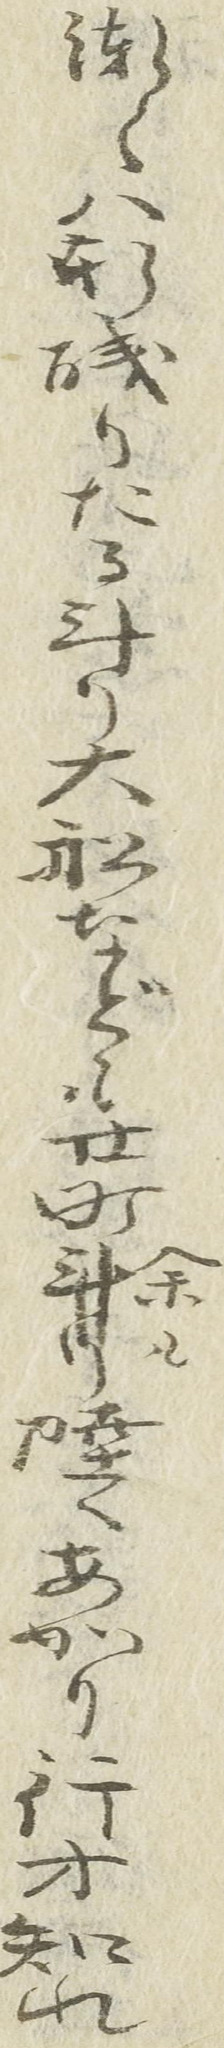漸く八軒残りたる斗り大舩なども廿町余も陸へあかり行方知れ
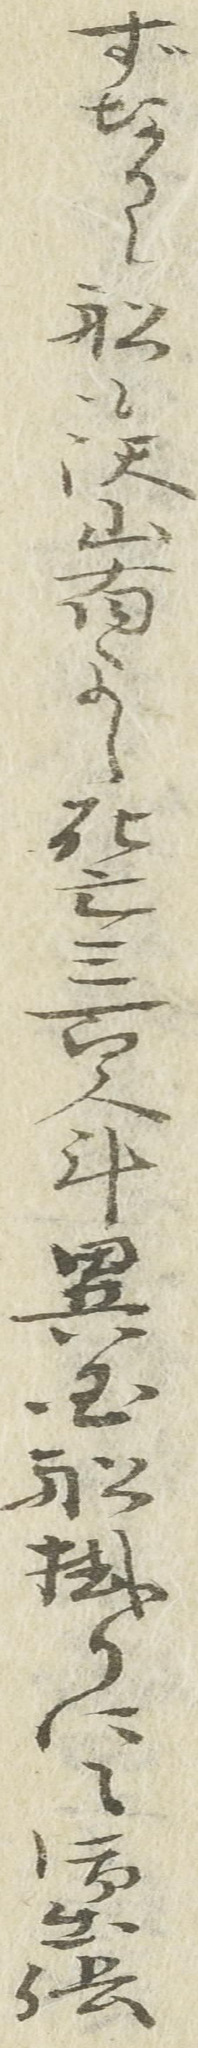ずなりし舩も沢山有よし死亡三百人斗異国舩掛りにて御出張
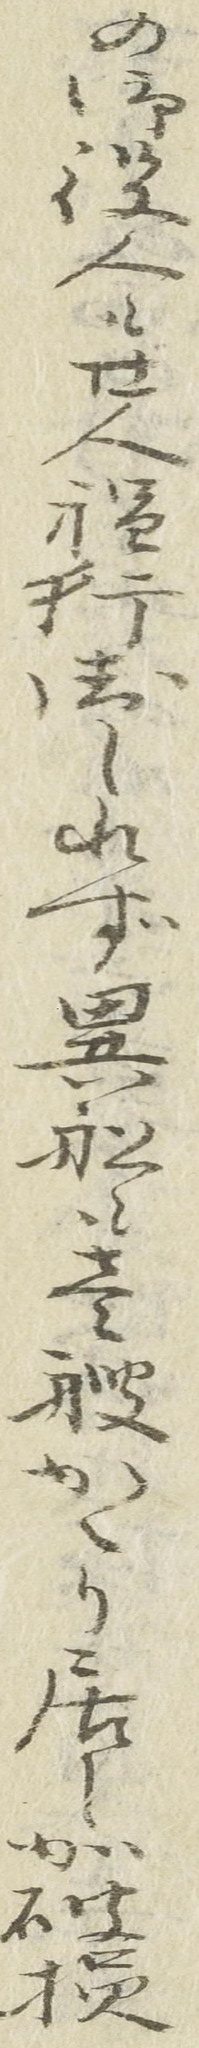の御役人も廿人程行衛しれず異舩も壱艘かゝり居しか破損
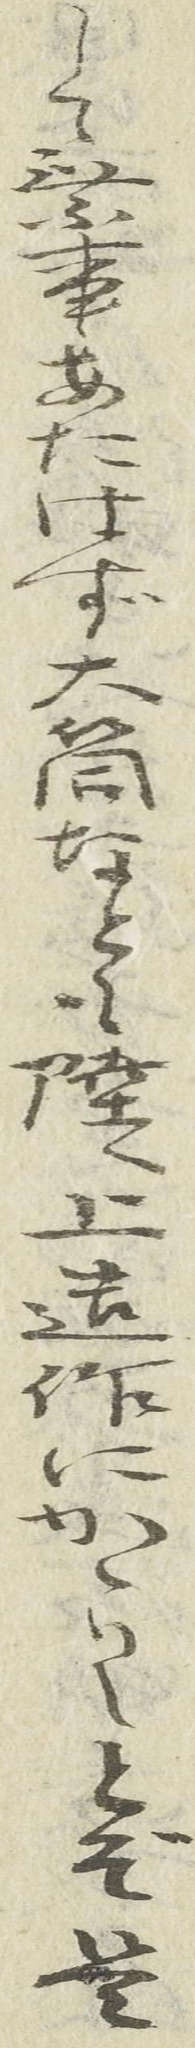して乗事あたはず大筒なとも陸へ上造作にかゝりしとぞ是
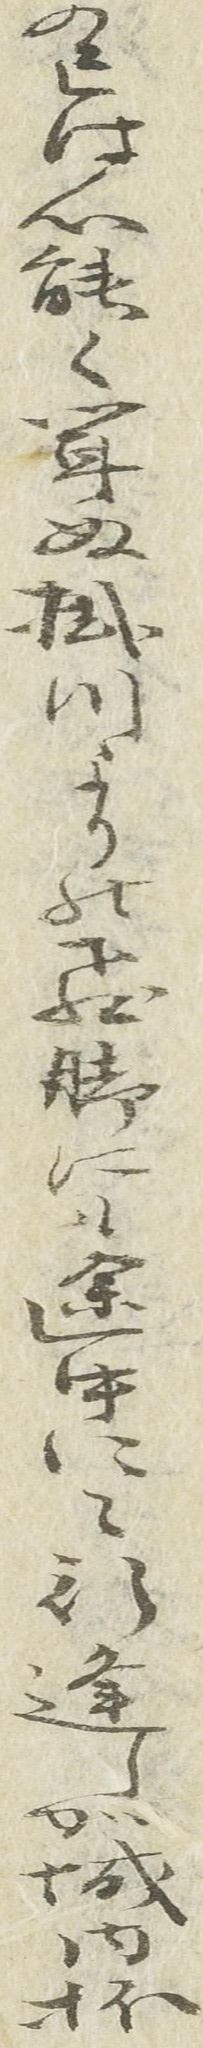のみは心能く聞ぬ掛川よりの飛脚にも途中にて行逢しか城内抔
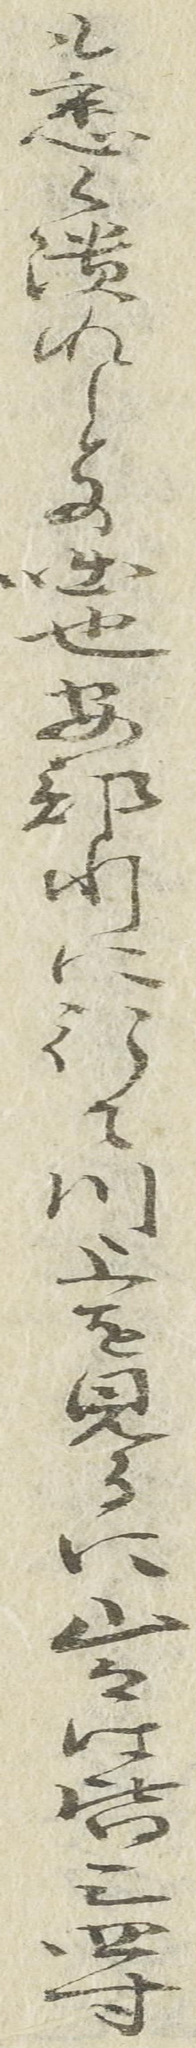も悉く潰れしとの咄也安部川に行て川上を見るに山々は皆三四寸
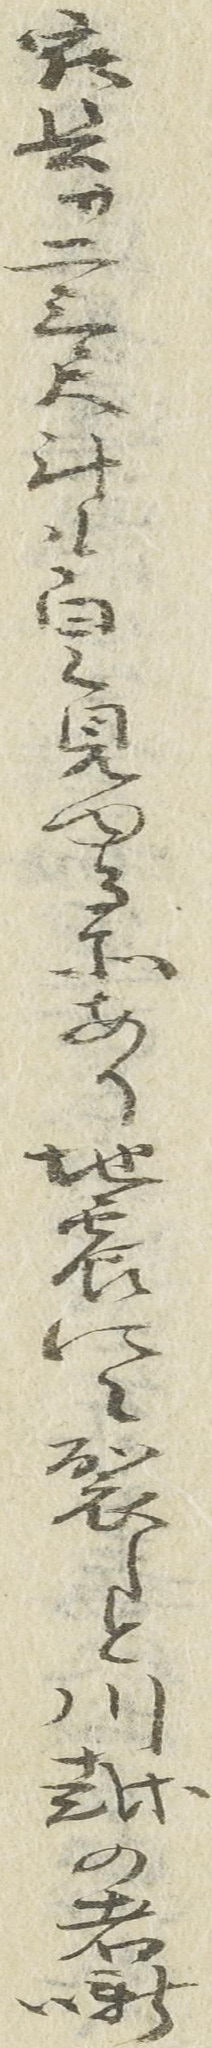宛長二三尺斗も白く見ゆる所あり地震にて裂しと川越の者噺
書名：地震前兆集　全
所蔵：東京大学地震研究所図書室 Earthquake Research Institute Library, The University of Tokyo, JAPAN
